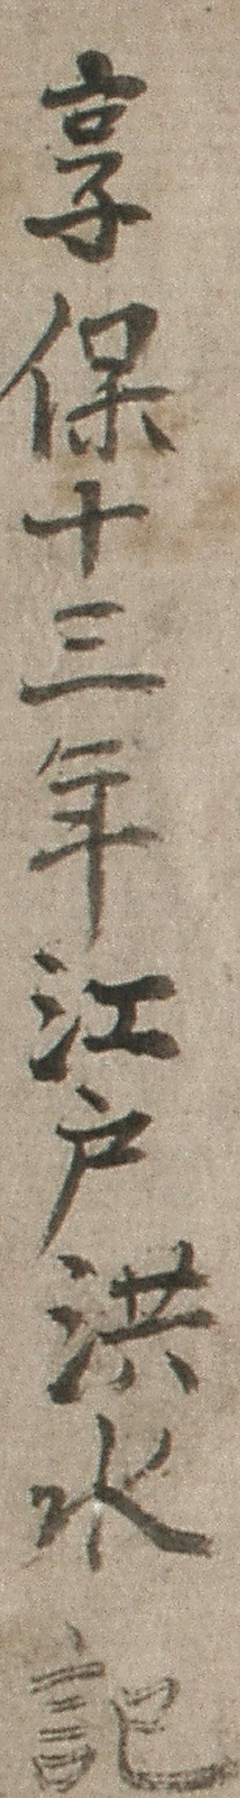享保十三年江戸洪水記

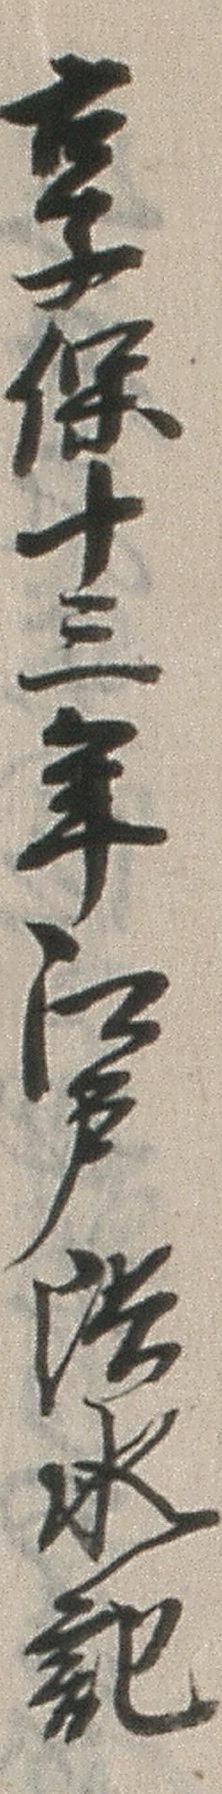享保十三年江戸洪水記
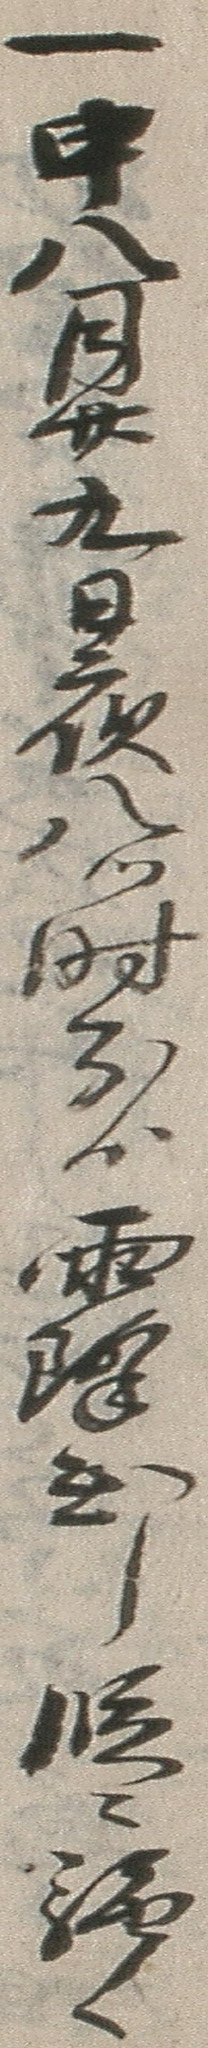一申八月廿九日夜八ツ時分ゟ雨降出し段々強く
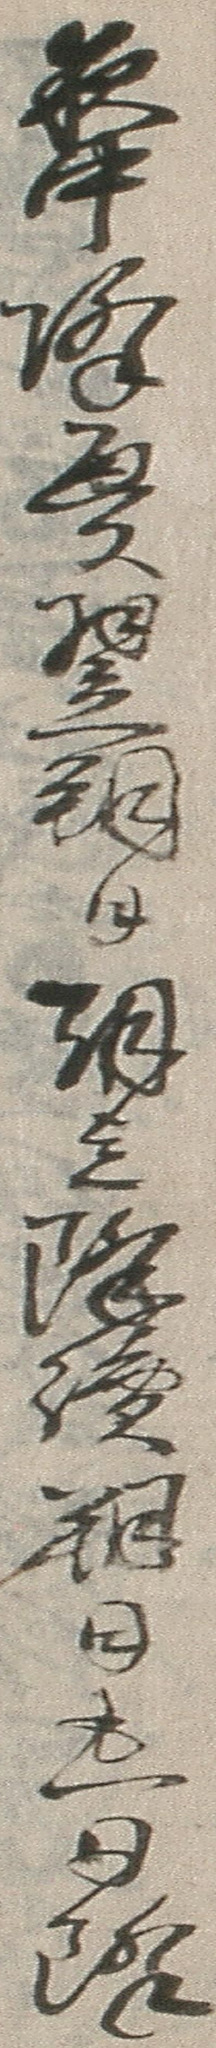夜中降通ス翌朔日朝迄降続朔日も一日降候
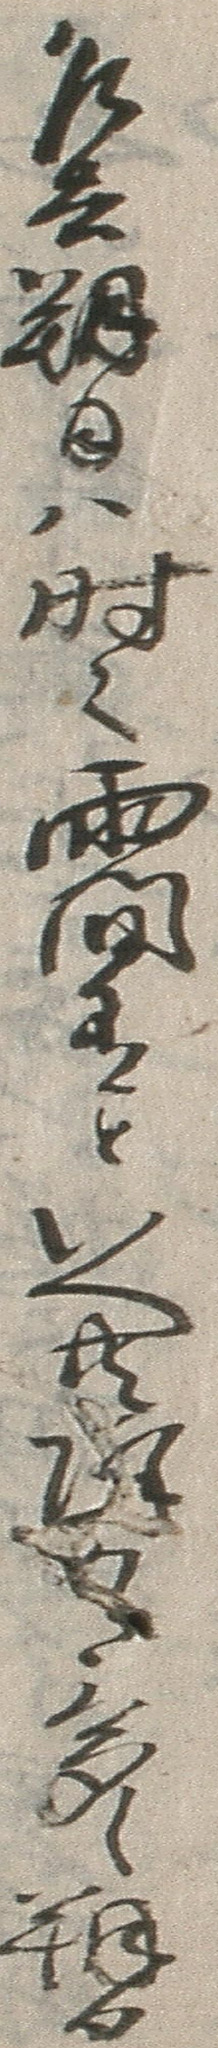乍去朔日ハ時々雨間有といへ共降かた多し朔日
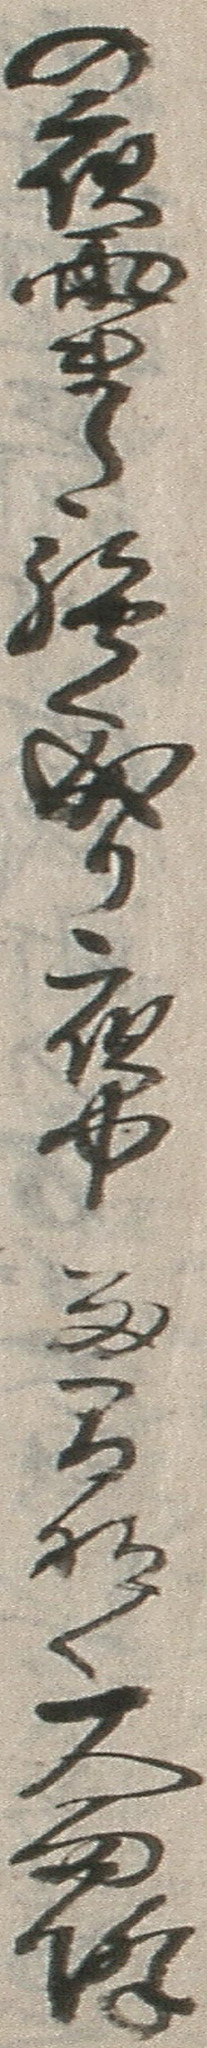の夜雨また強く成り夜中雨間なく大雨降
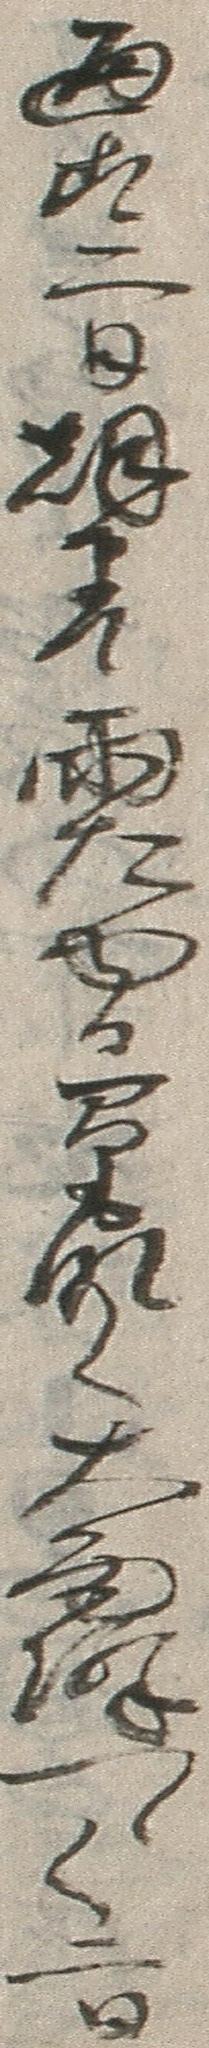通す二日朝まて雨たゆる間もなく大雨降つゝく二日
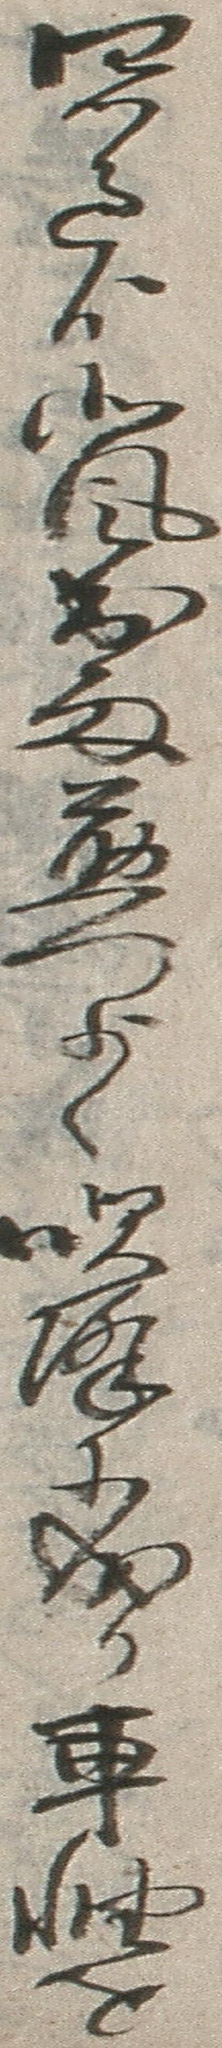四ツ過ゟ北風出雨愈つよく吹降に成り車軸を
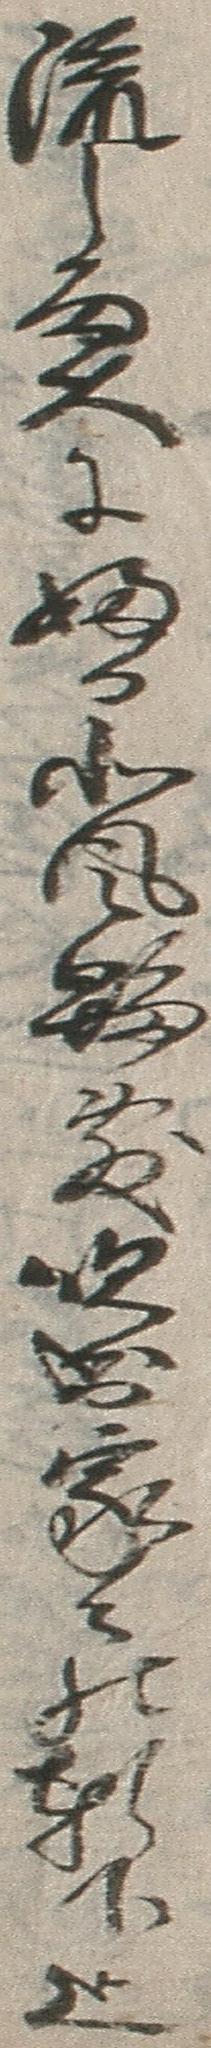流し雨大にふる北風夥敷吹出家々の軒下迄
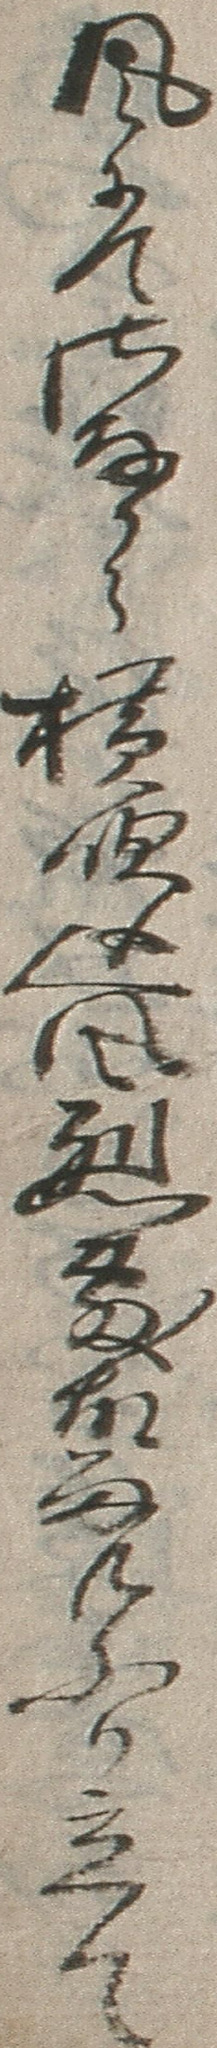風にてさなから横吹込風烈敷故雨けふり立て

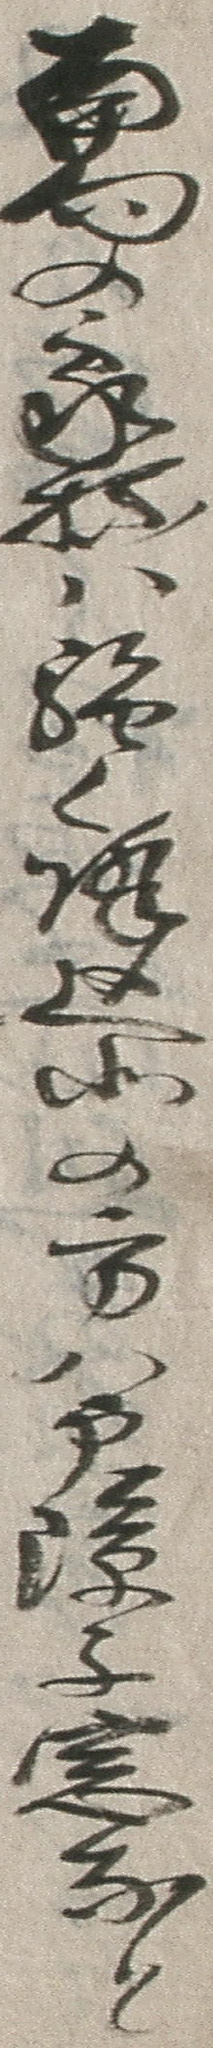南向の家抔は強く降込北の方は戸障子窓なと
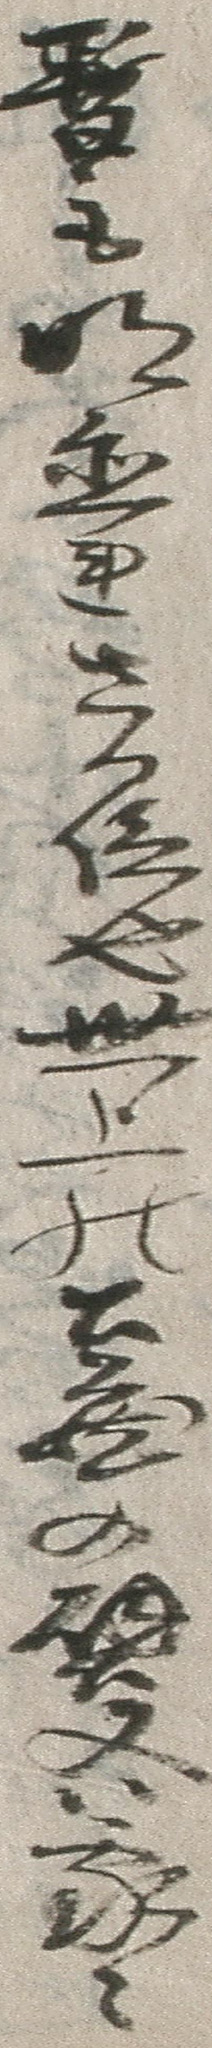暫も明置れさる位也世上の土蔵の壁又は家々
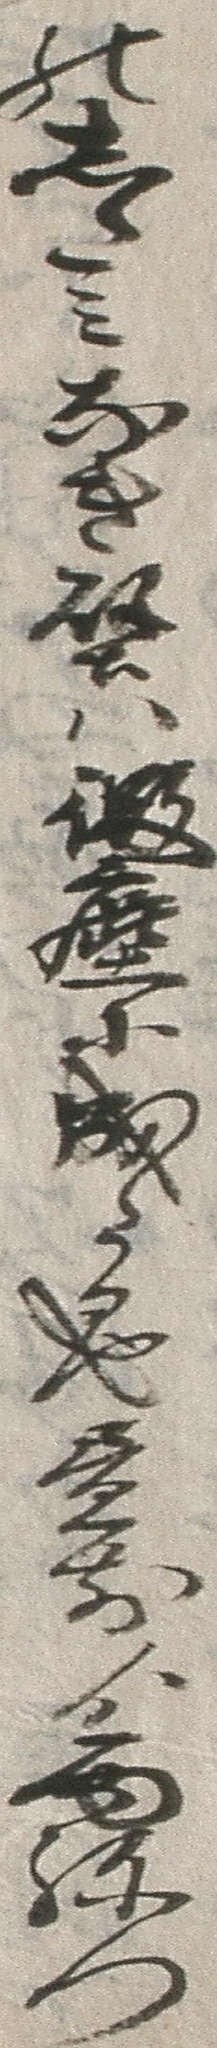のしたみなき壁は微塵に成たる也昼前ゟ雨弥つ
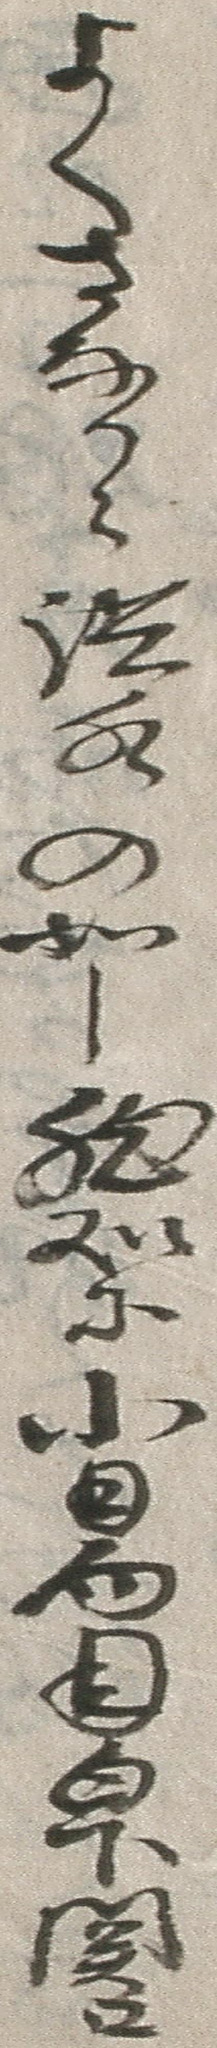よくさなから洪水の如し然処に小日向目白下関口
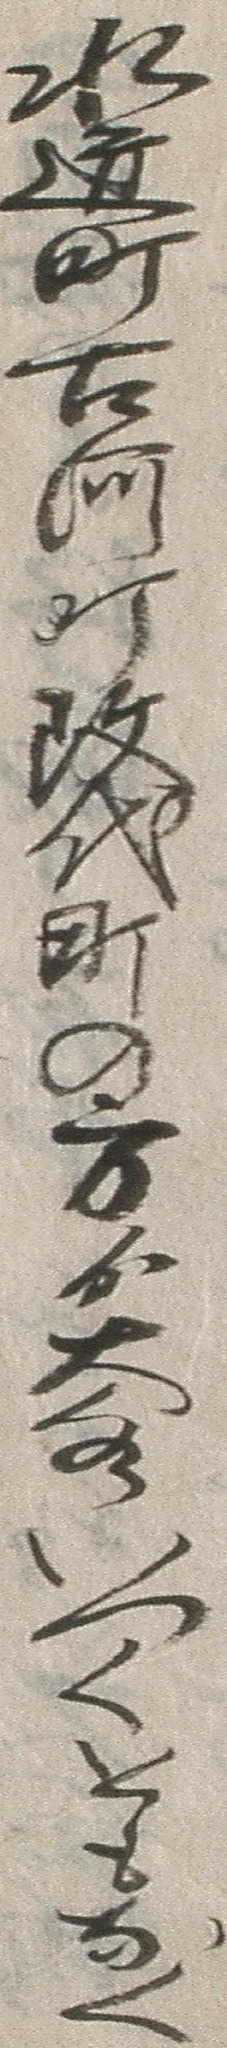水道町古河町改代町の方ゟ大水いつくともなく
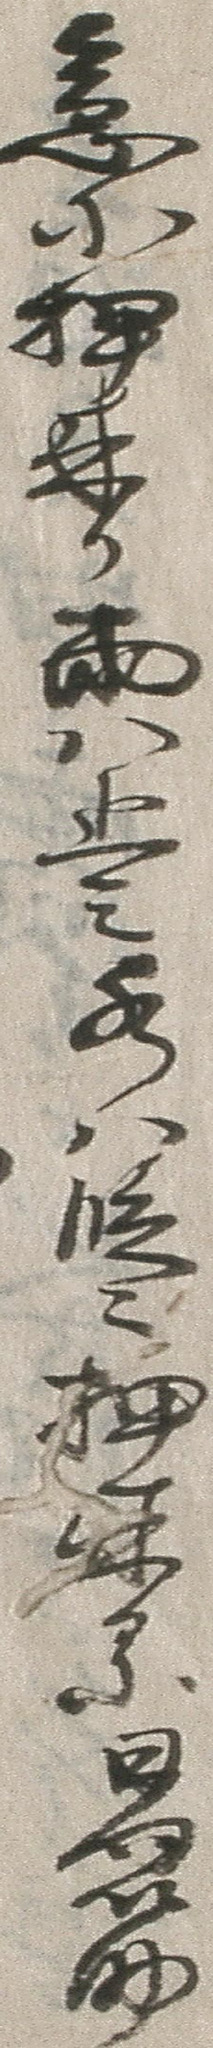急に押来り雨は止み水は段々押来る小日向筋
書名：享保十三年江戸洪水記
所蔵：東京大学地震研究所図書室 Earthquake Research Institute Library, The University of Tokyo, JAPAN
